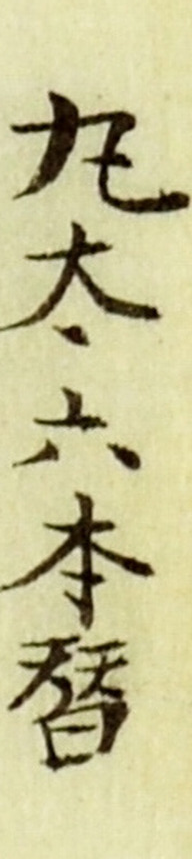丸太六本替
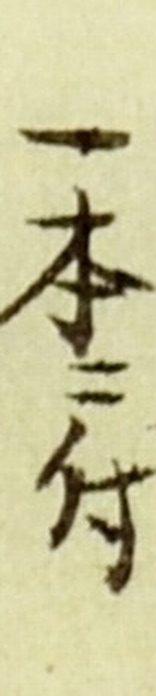一本二付
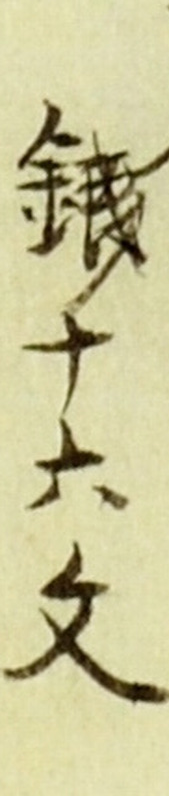銭十六文
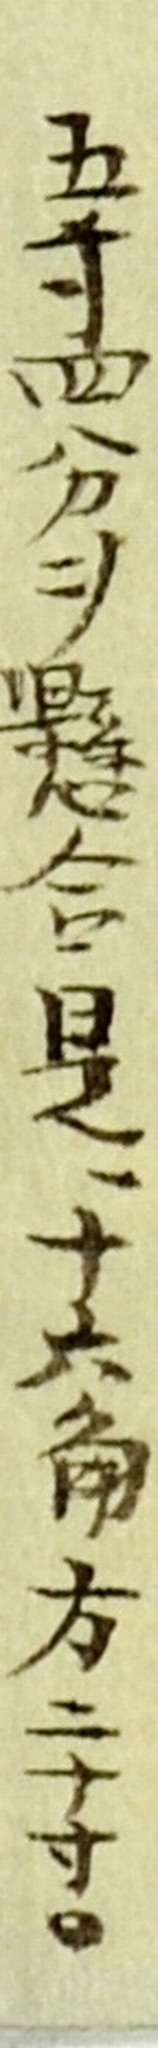五寸四分ヲ懸合是ニ十六角方二十寸口
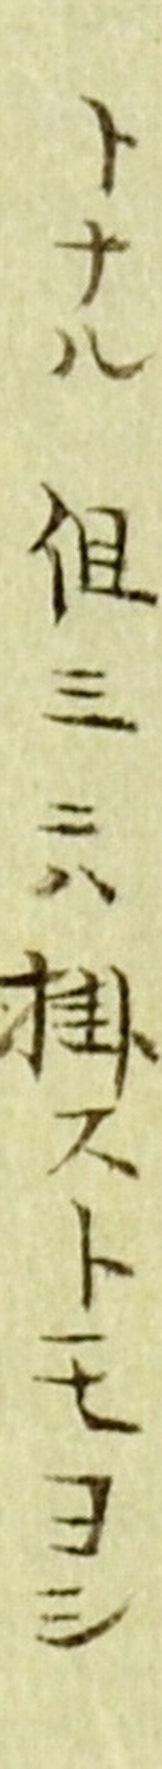トナル但三ニハ掛ストモヨシ
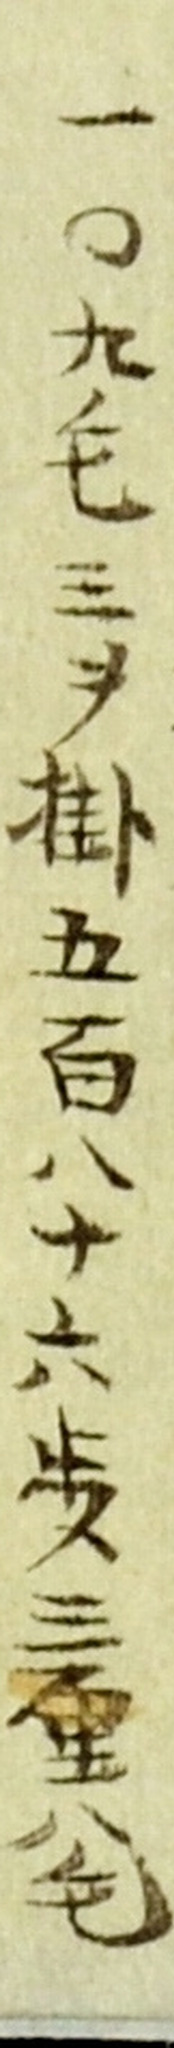一〇九毛三ヲ掛五百八十六歩三厘八毛
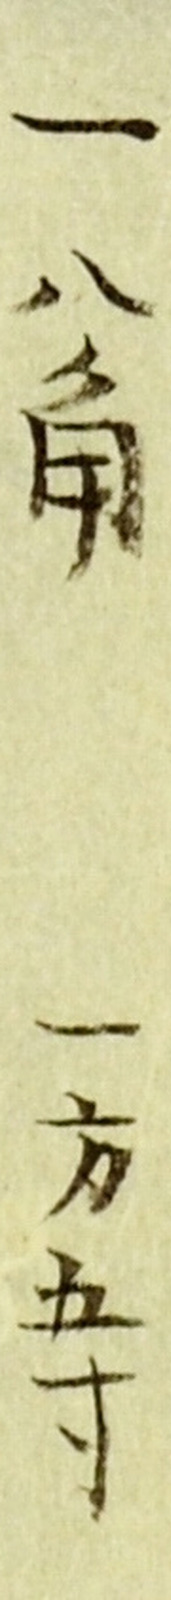一八角一方五寸
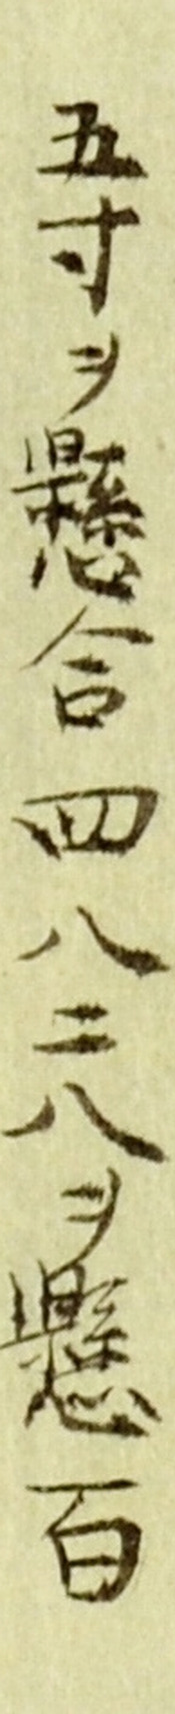五寸ヲ懸合四八二八ヲ懸百
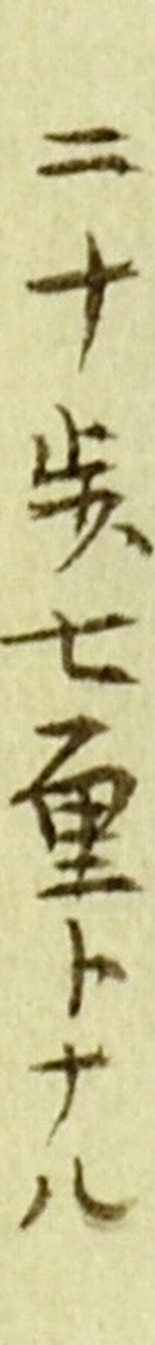二十歩七厘トナル
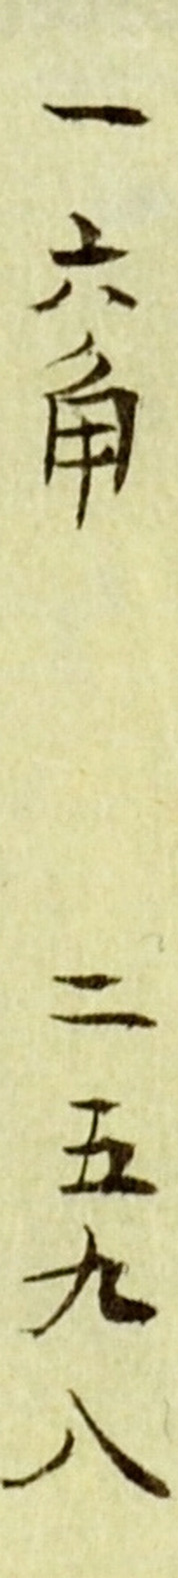一六角二五九入
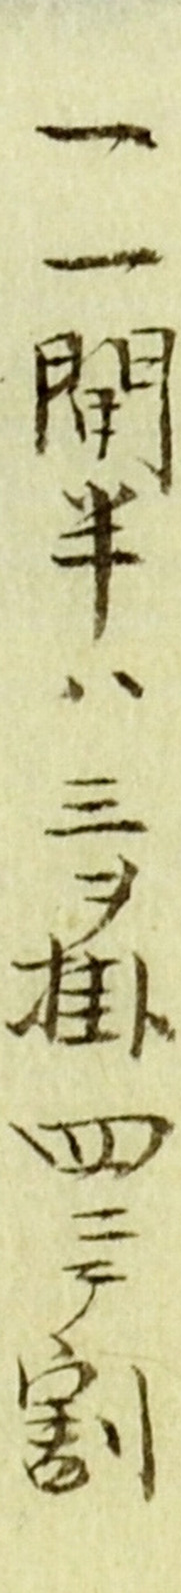一一間ハ二ヲ掛四ニテ割
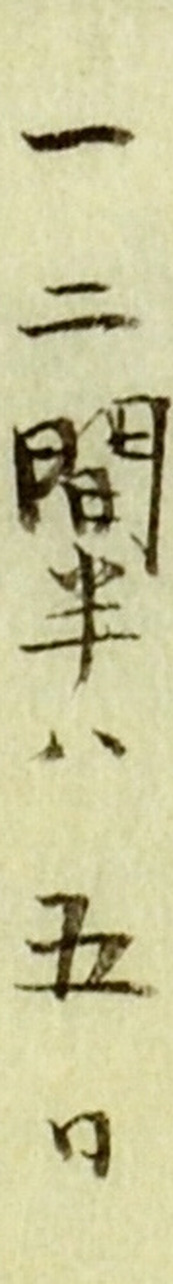一二間半ハ五口
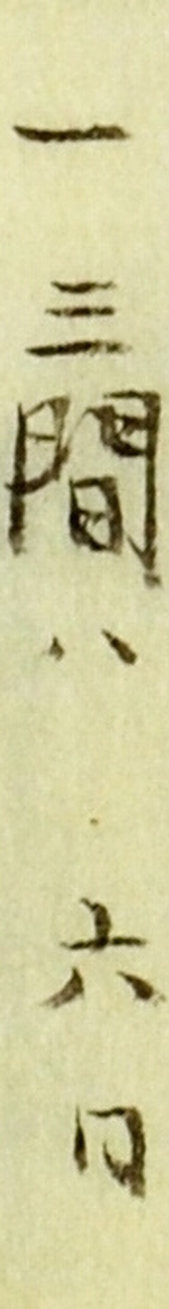一三間ハ六口
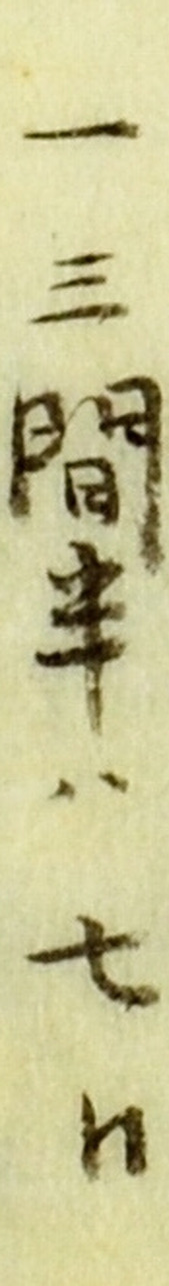一三間半ハ七口
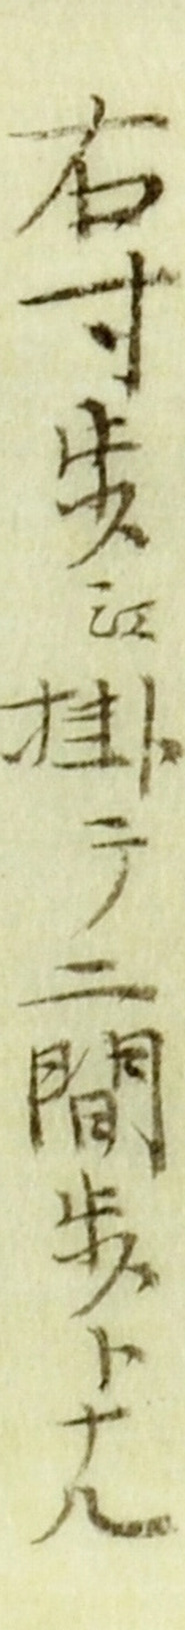右寸歩江掛テ二間歩トナル
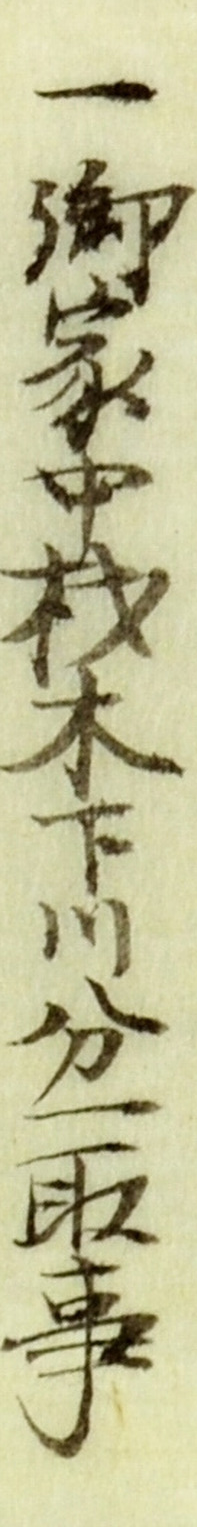一御家中材木下川分一取事
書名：分一御定法
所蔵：伊那市立高遠町図書館・合同会社AMANE
